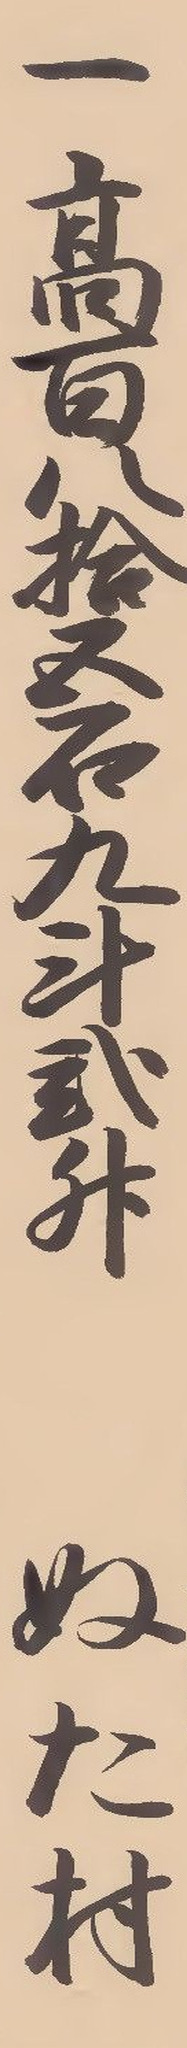一髙百八拾五石九斗弐升ぬた村
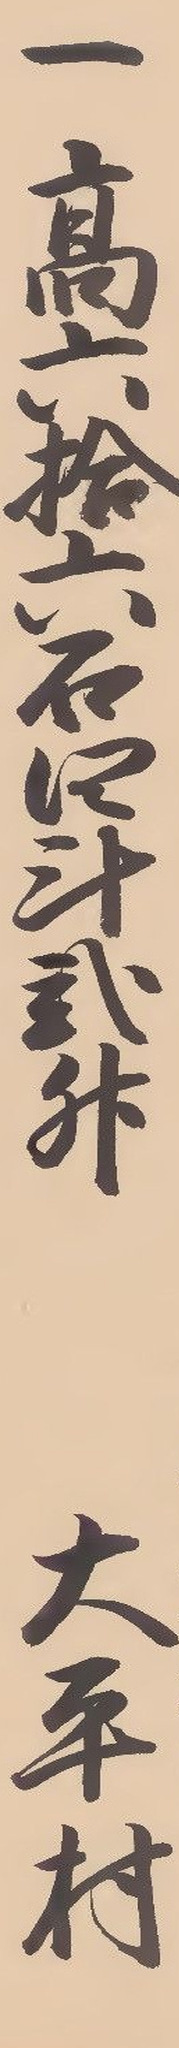一髙六拾六石四斗弐升大平村

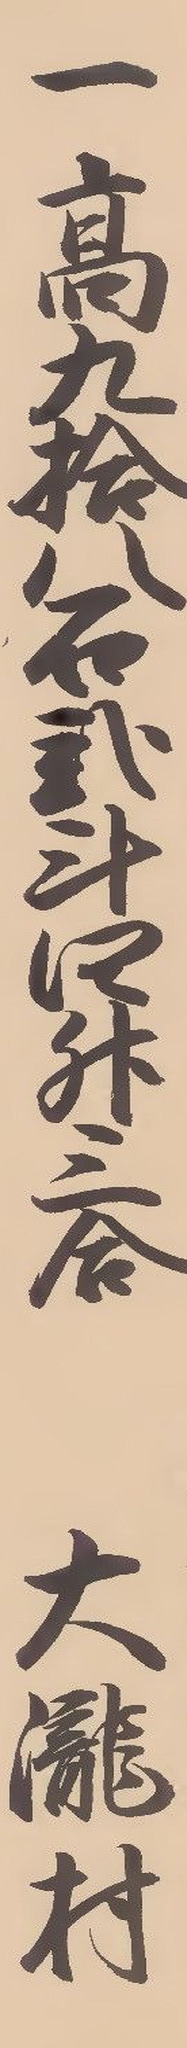一髙九拾八石弐斗四升三合大瀧村
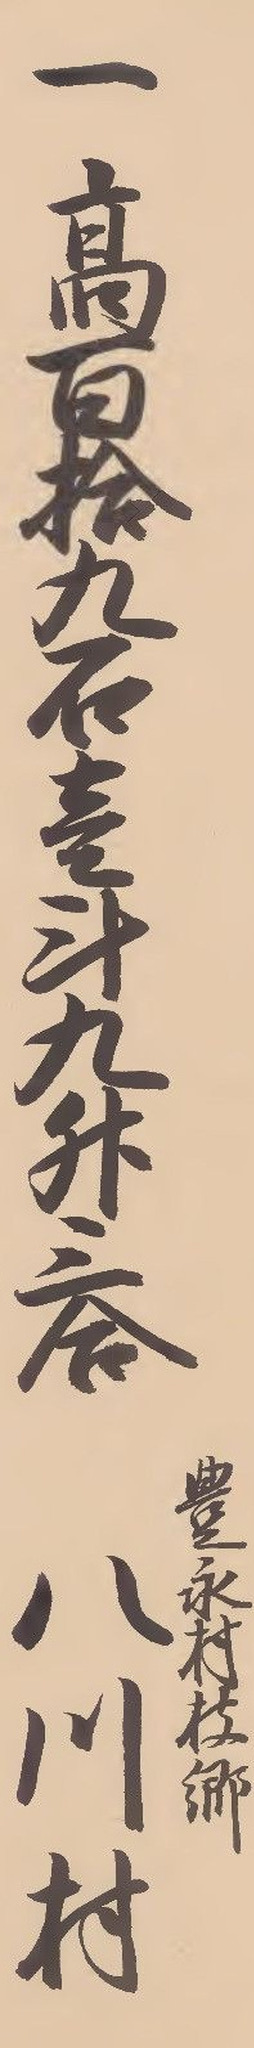一髙百拾九石壱斗九升三合八川村
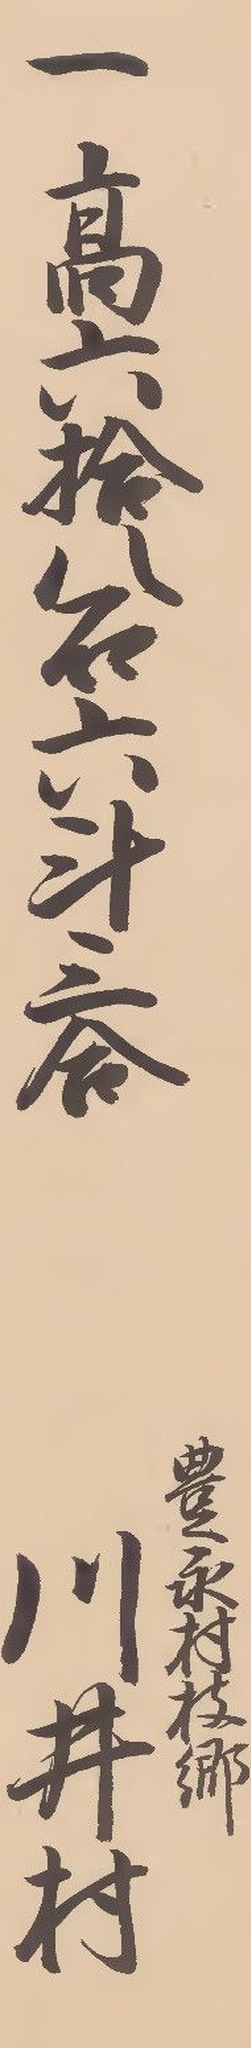一髙六拾八石六斗三合川井村
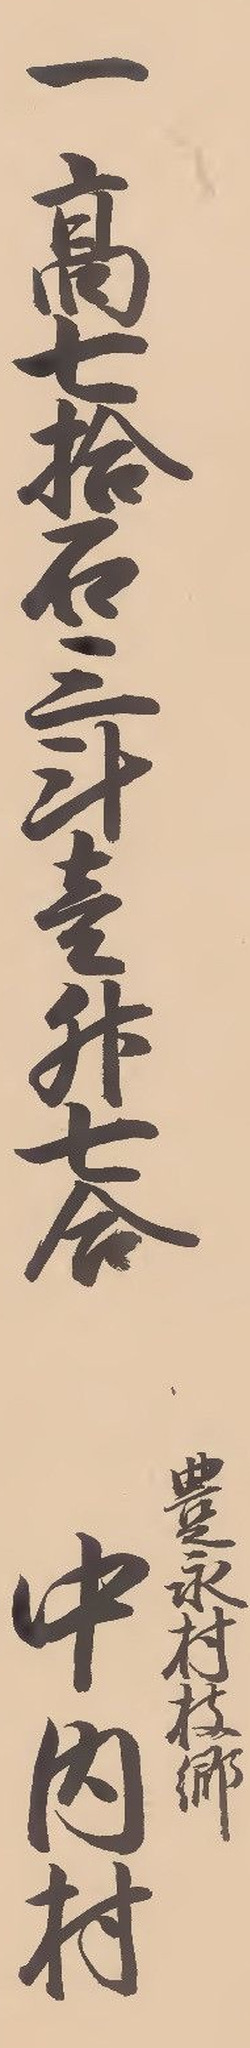一髙七拾石三斗壱升七合中内村
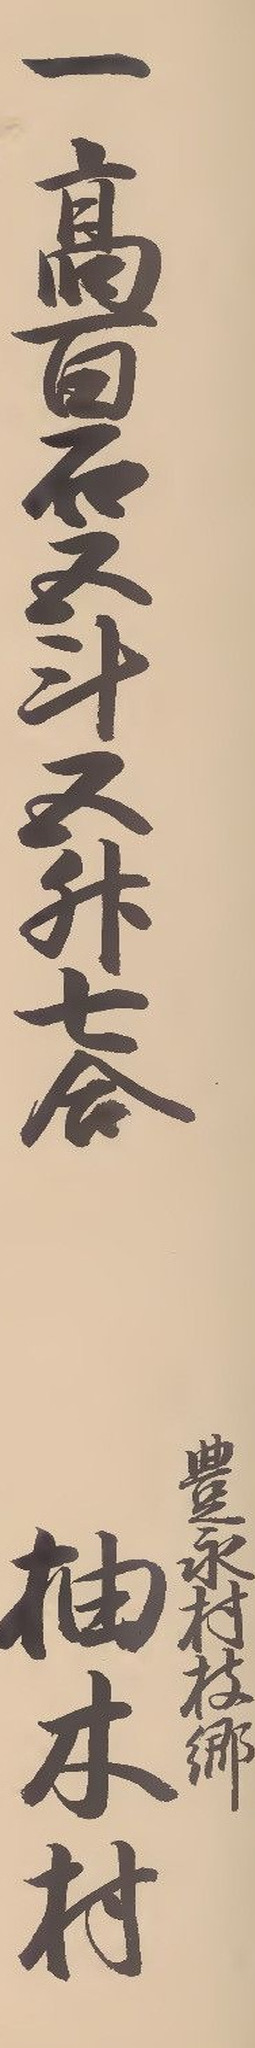一髙百石五斗五升七合柚木村
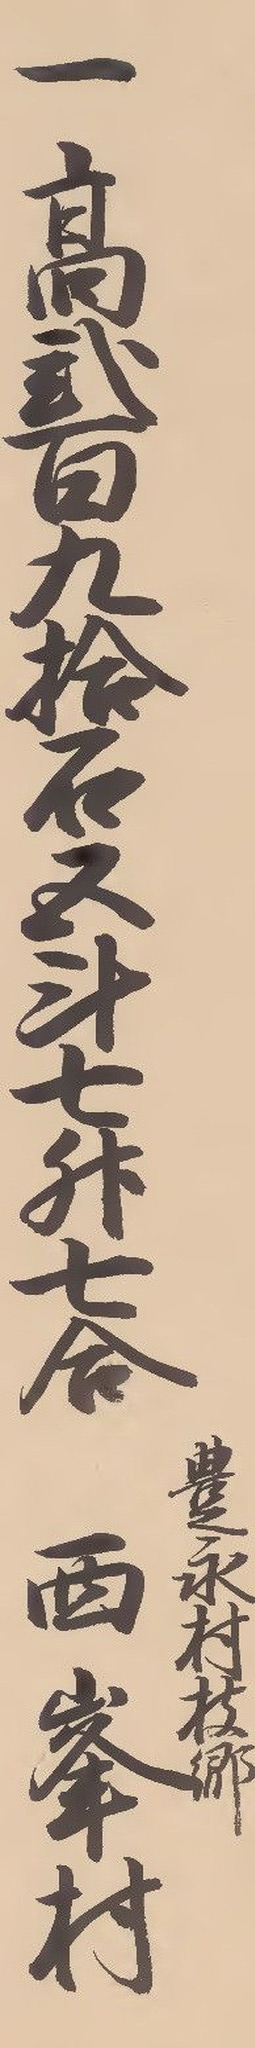一髙弐百九拾石五斗七升七合西峯村
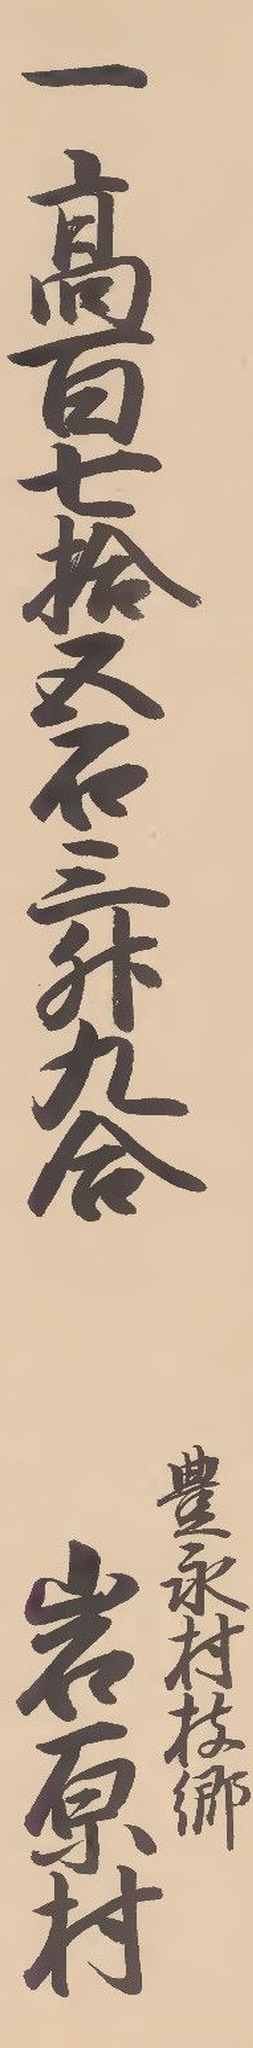一髙百七拾五石三升九合岩原村

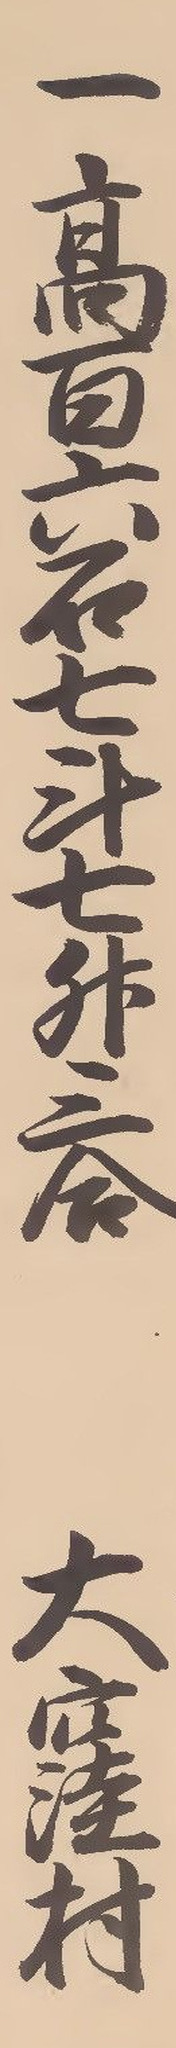一髙百六石七斗七升三合大窪村
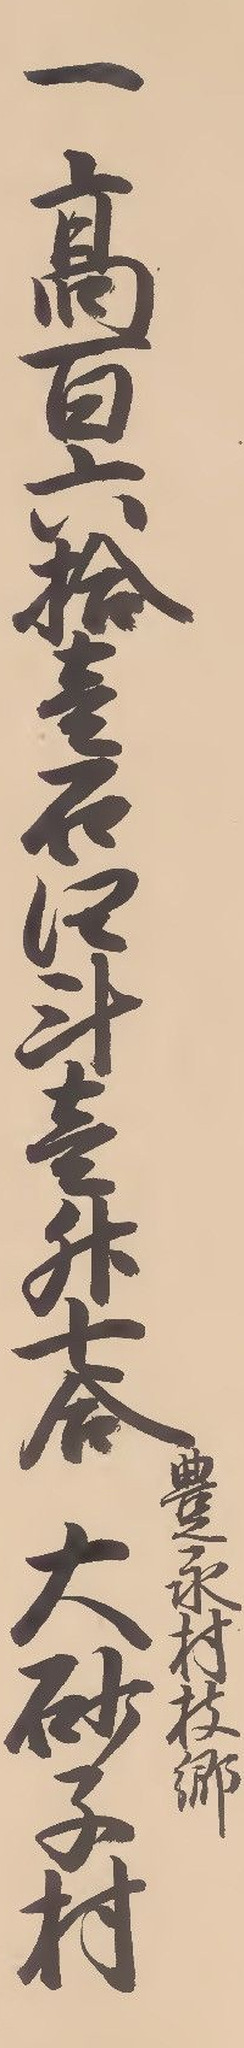一髙百六拾壱石四斗壱升七合大砂子村
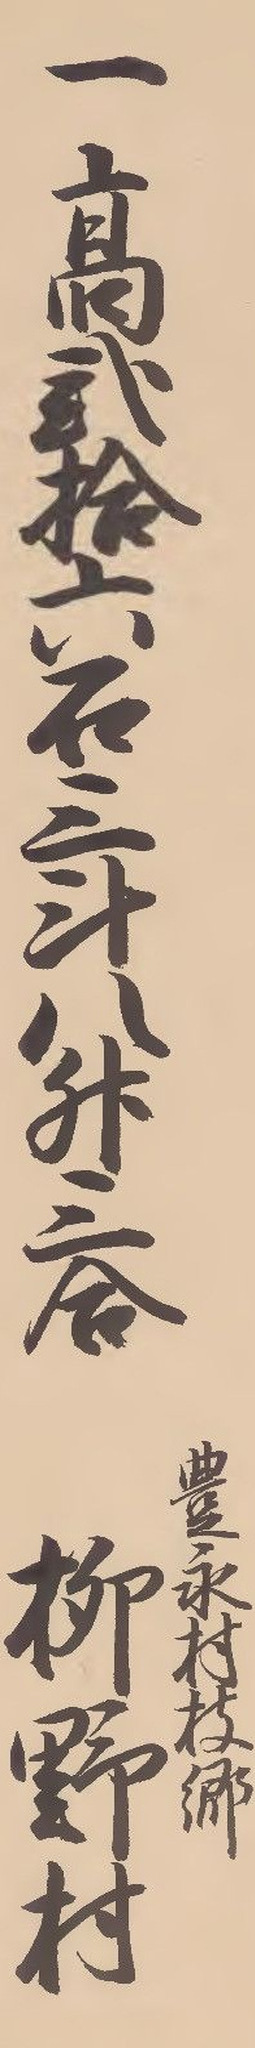一髙弐拾六石三斗八升三合柳野村
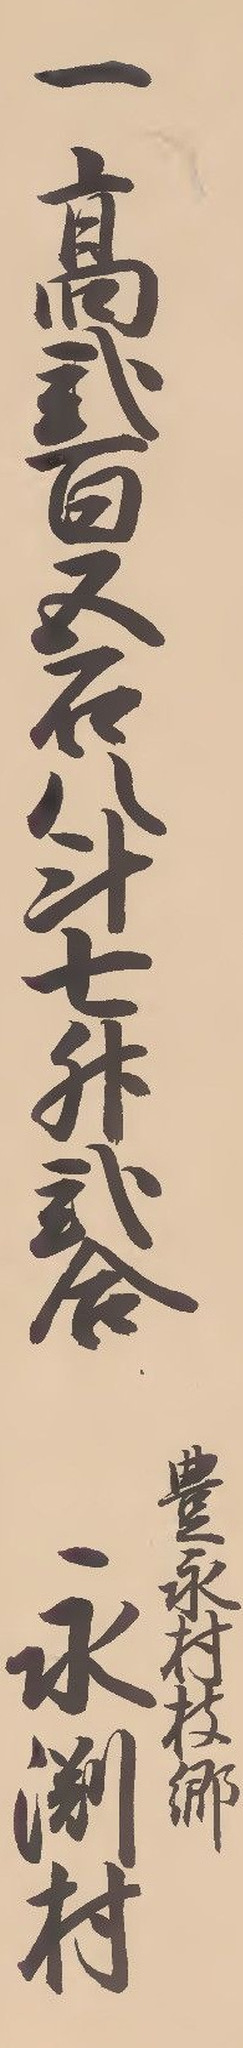一髙弐百五石八斗七升弐合永渕村
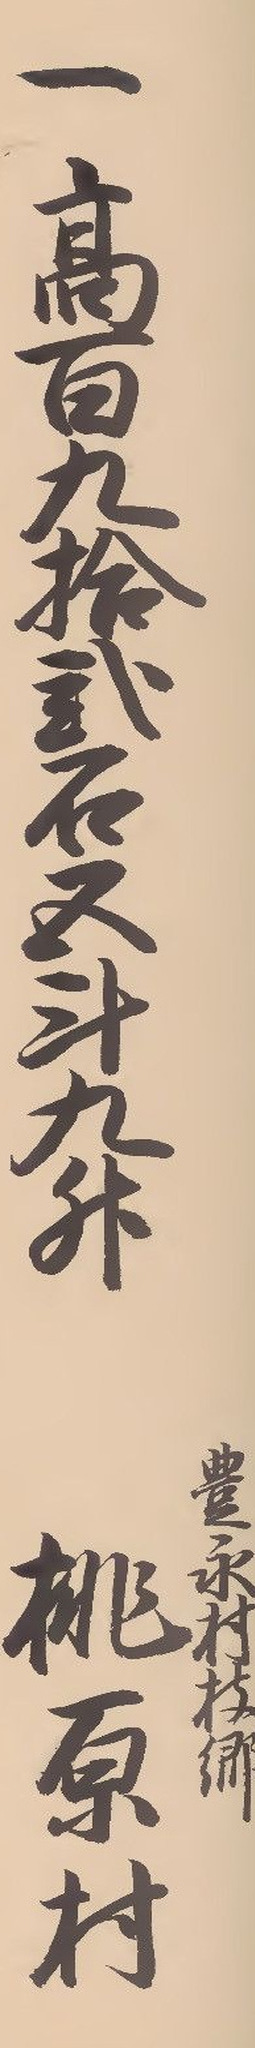一髙百九拾弐石五斗九升桃原村
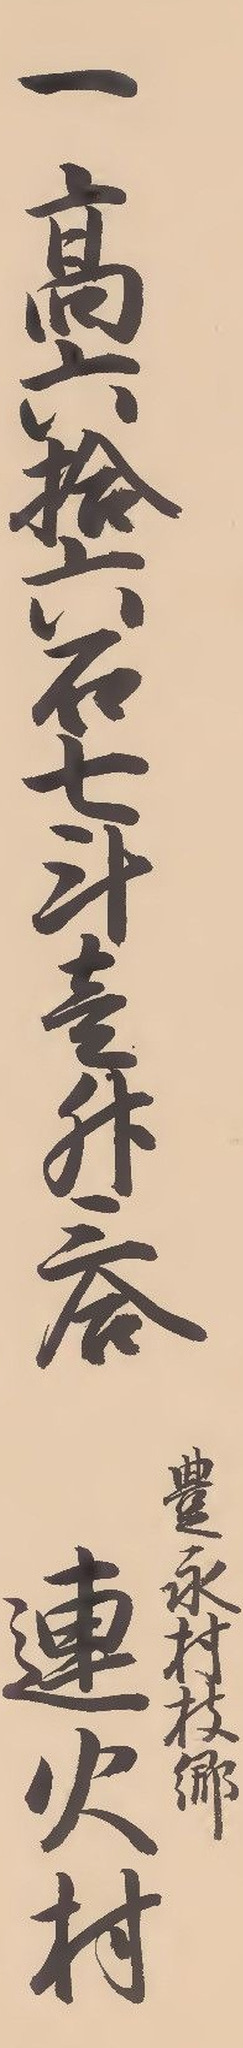一髙六拾六石七斗壱升三合連火村
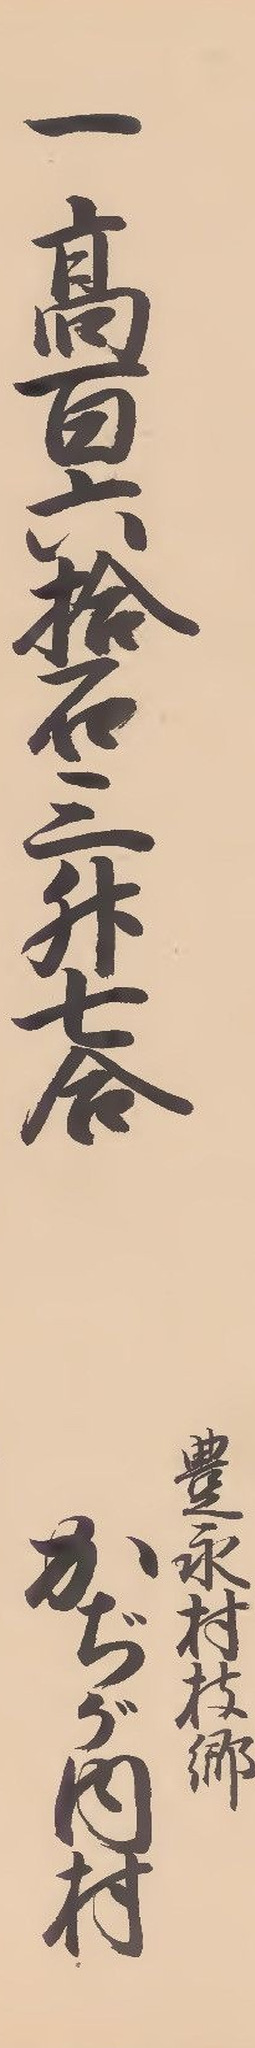一髙百六拾石三升七合かぢが内村
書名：土佐国郷帳
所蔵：国立公文書館 National Archives of Japan
